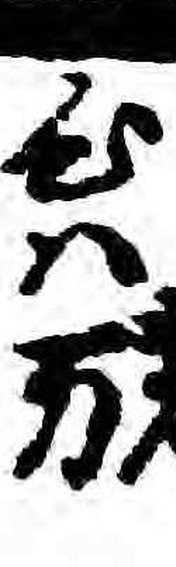心は万
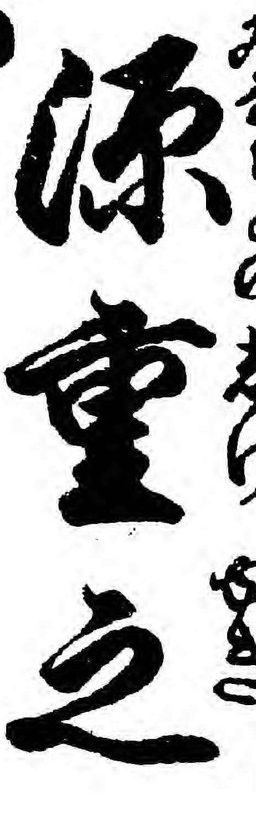源重之
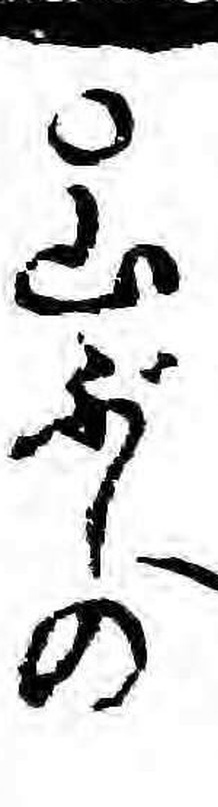〇山ぶしの
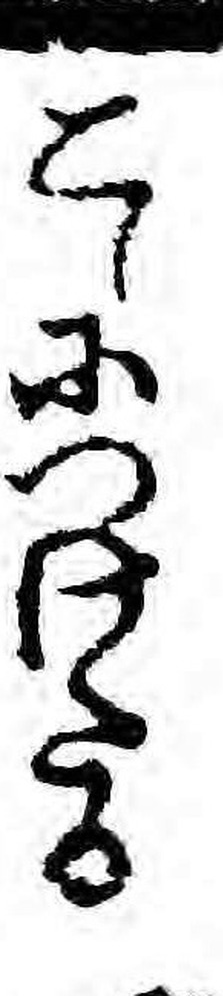こしにつけたる
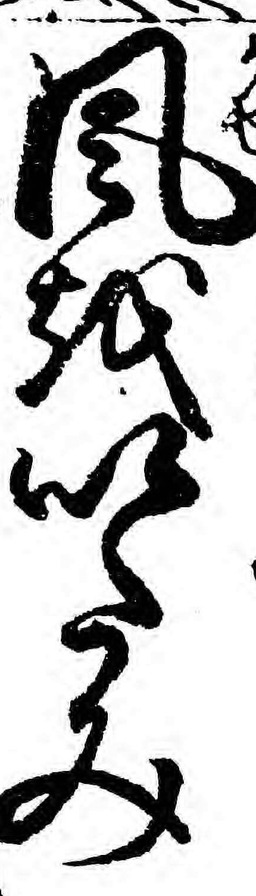風をいたみ
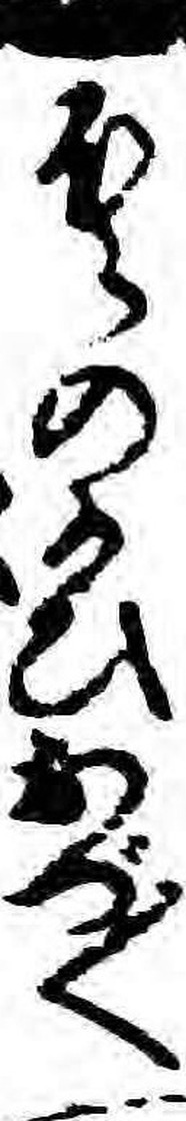ほらのかひおづ〳〵
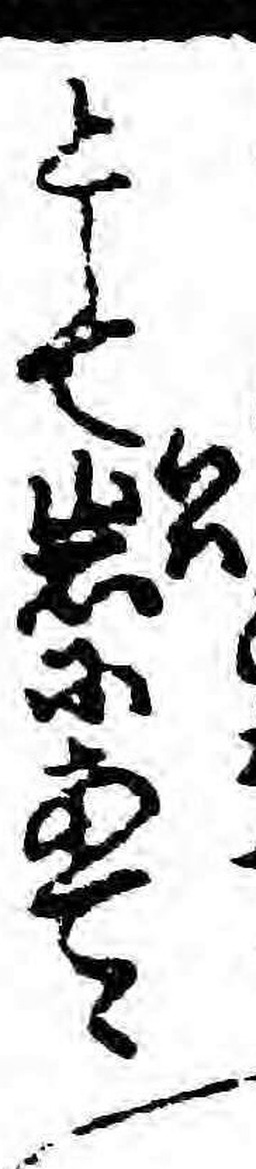として岩にあてゝ
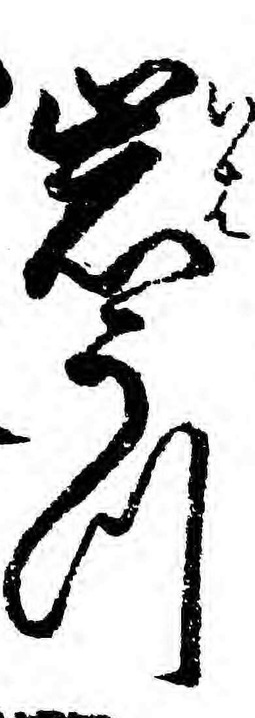岩うつ
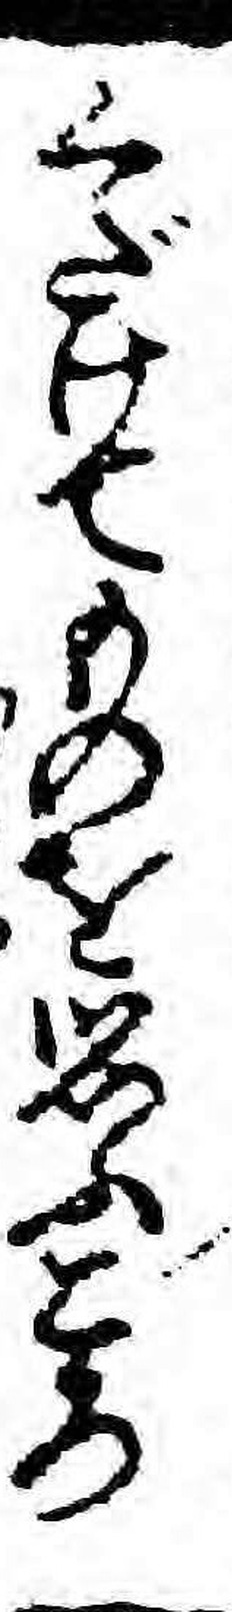くだけてものを思ふころ
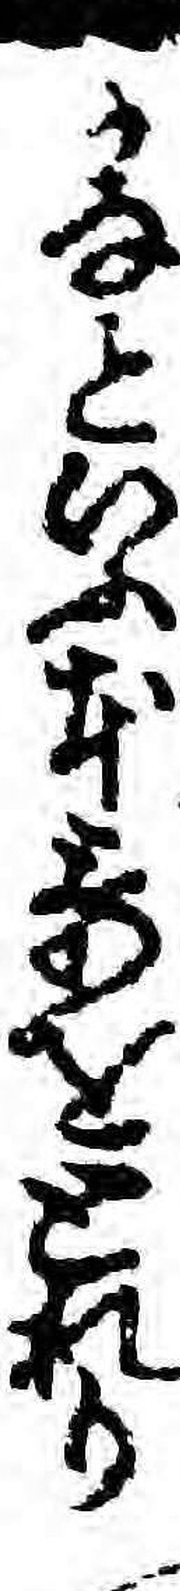かなといふ本哥をとれり
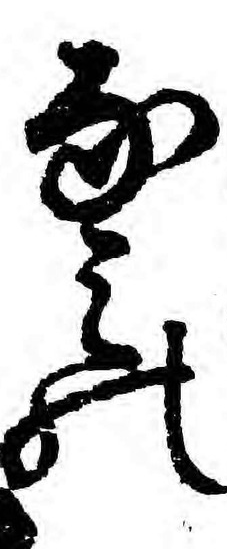なみの
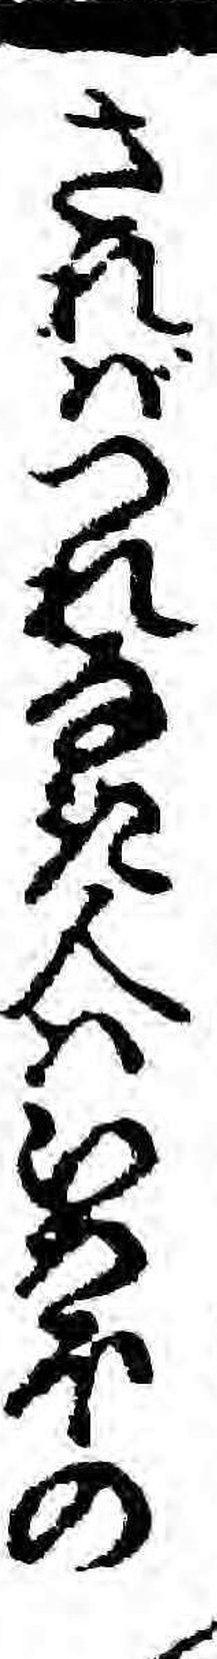さればつれなき人はいはほの
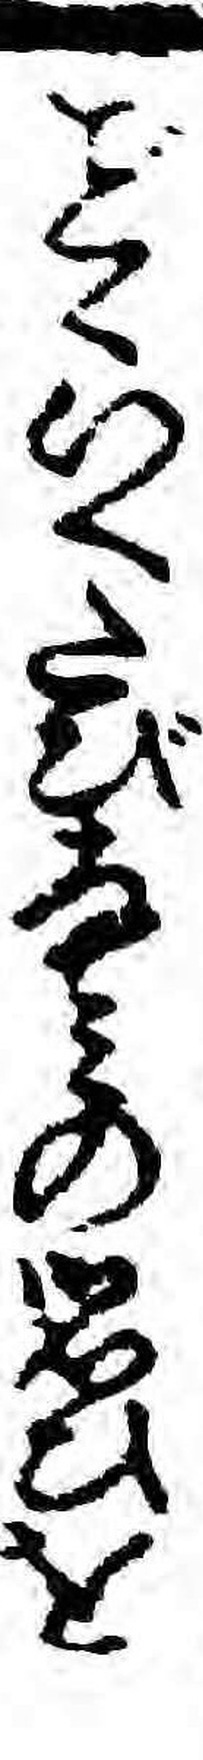ごとくいくたびなみの思ひを
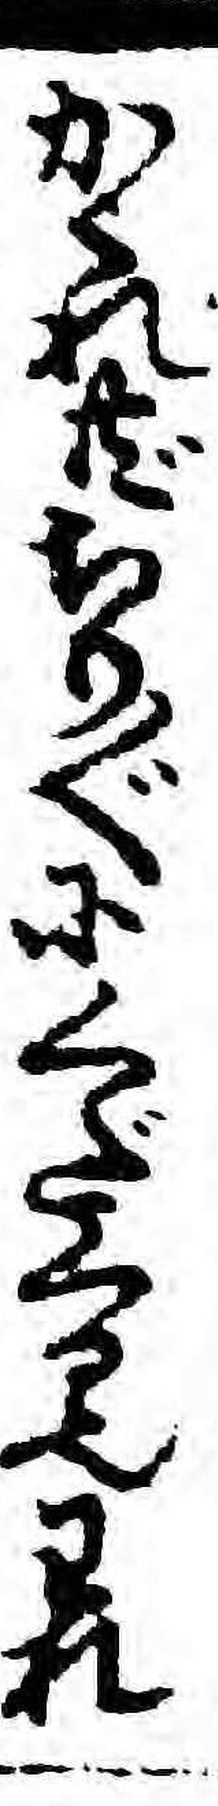かくれどもちり〴〵にくだくる也われ
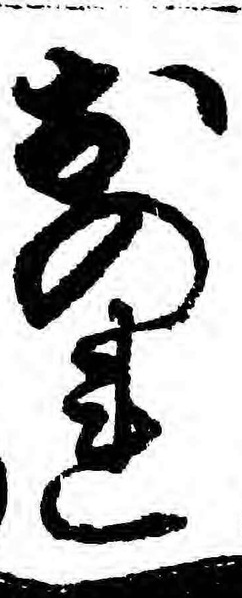おのれ
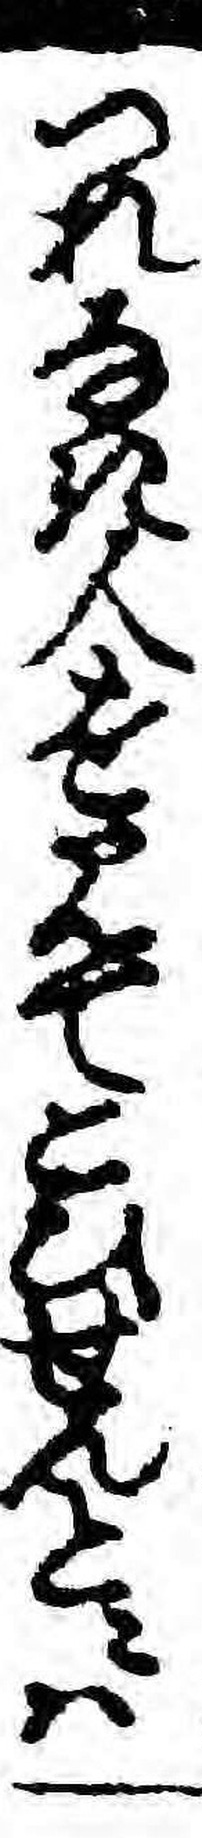つれなき人を見てこひせんとには
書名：頭書和歌注譯／壽賀多百人一首小倉錦
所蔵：国文学研究資料館
